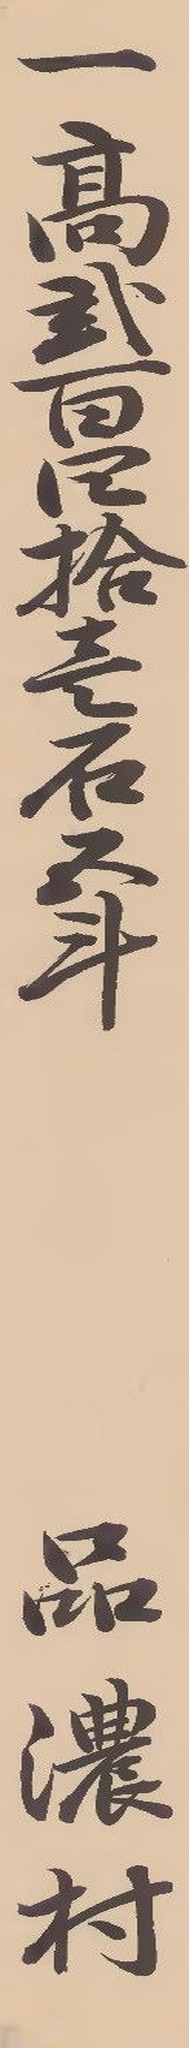一高弐百四拾壱石五斗品濃村
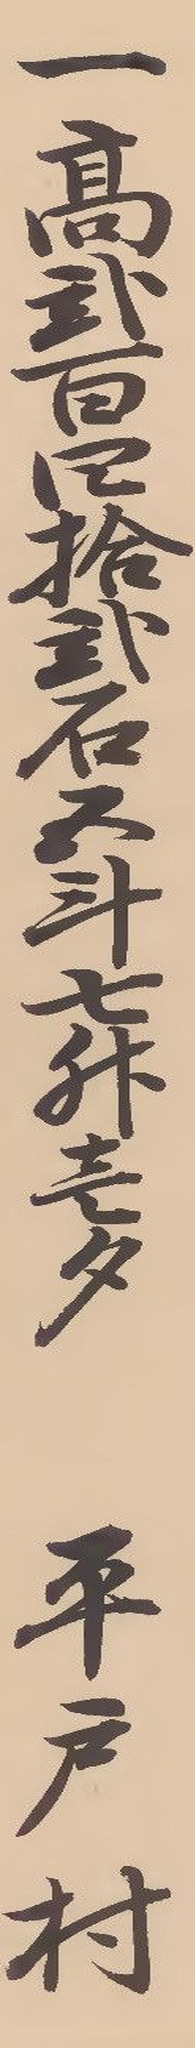一高弐百四拾弐石五斗七升壱勺平戸村

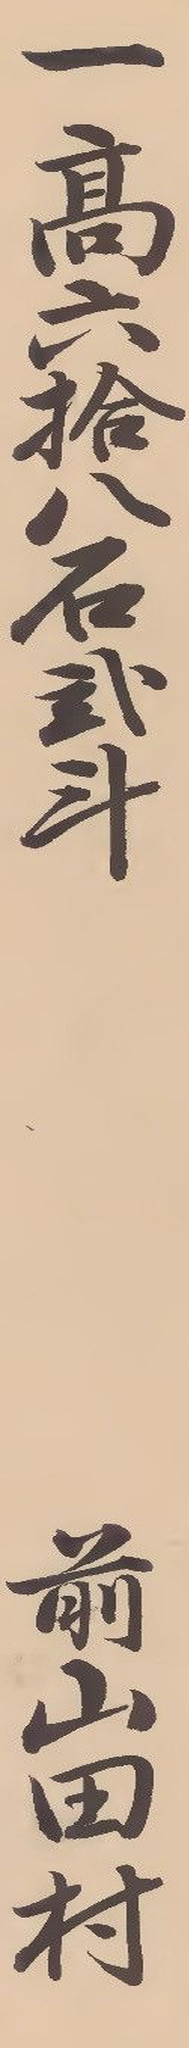一高六拾八石弐斗前山田村
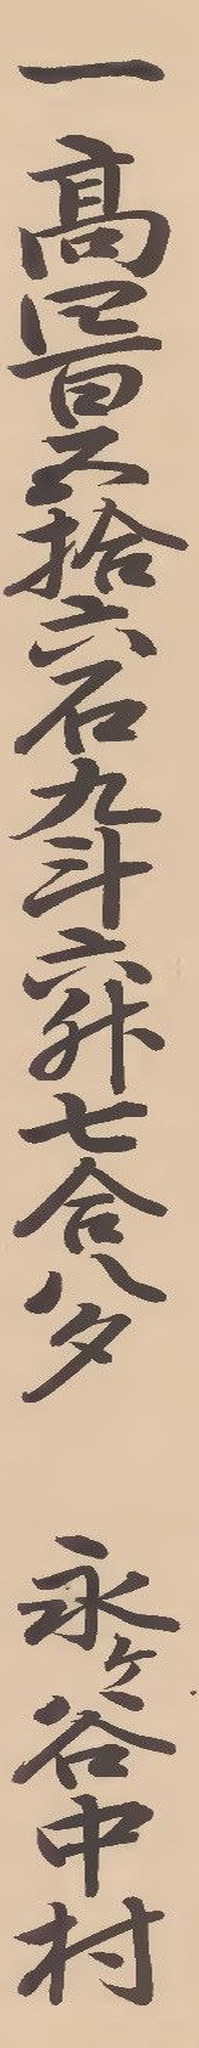一高四百五拾六石九斗六升七合八勺永ヶ谷中村
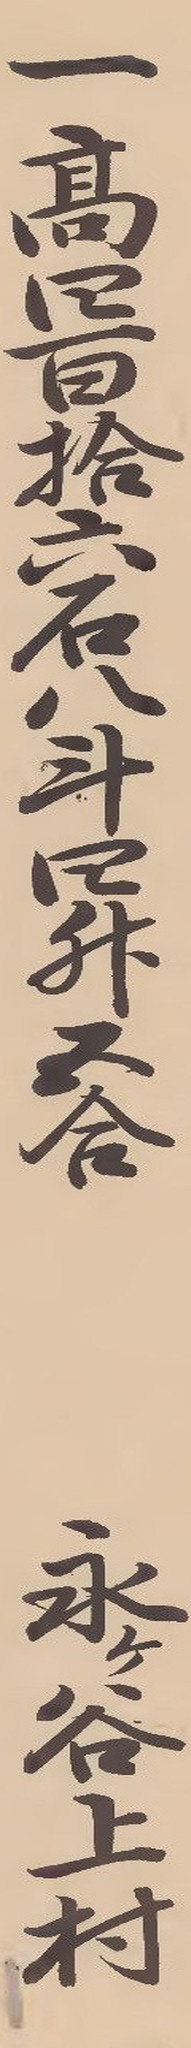一高四百拾六石八斗四升五合永ヶ谷上村
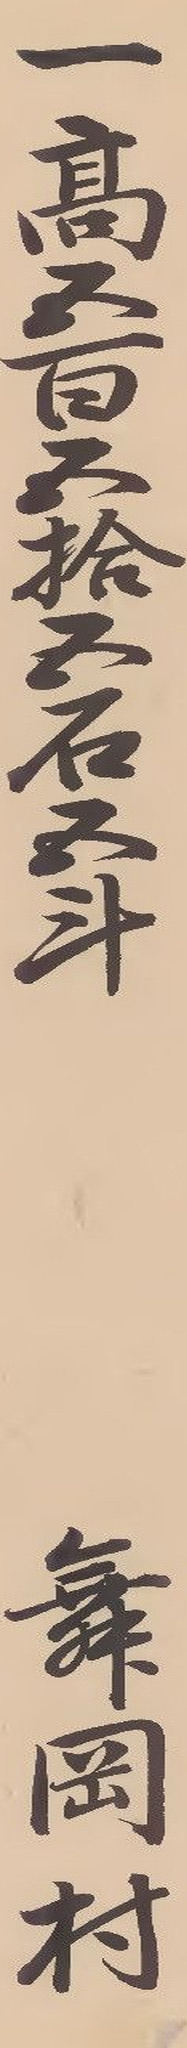一高五百五拾五石五斗舞岡村
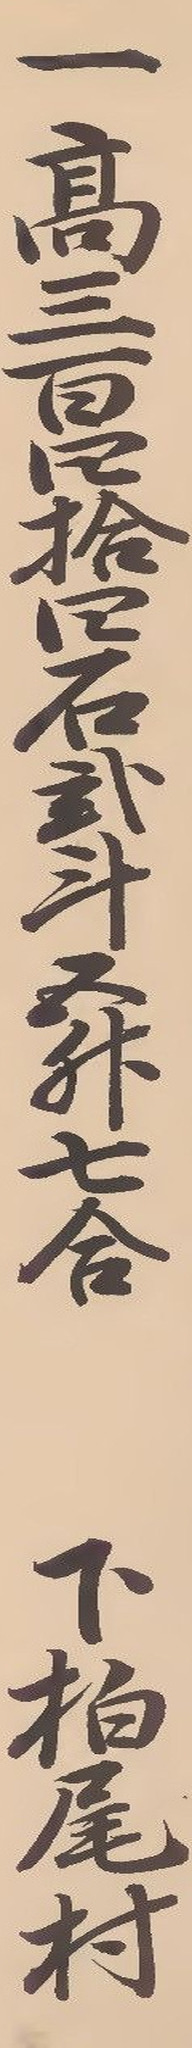一高三百四拾四石弐斗五升七合下柏尾村
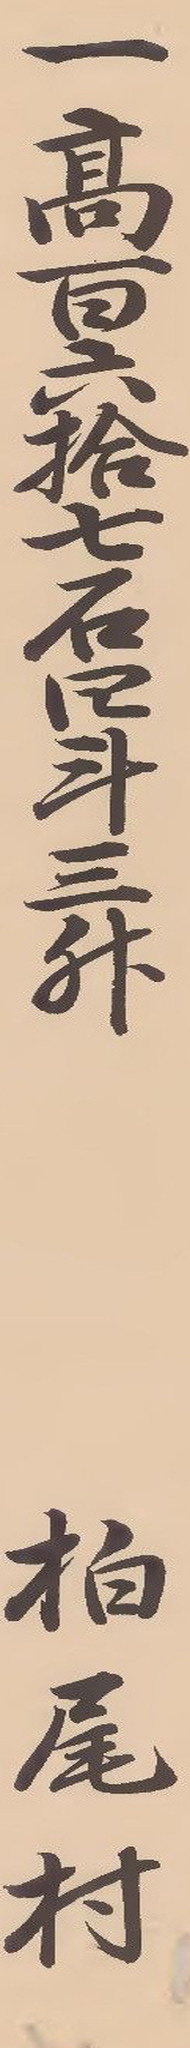一高百六拾七石四斗三升柏尾村
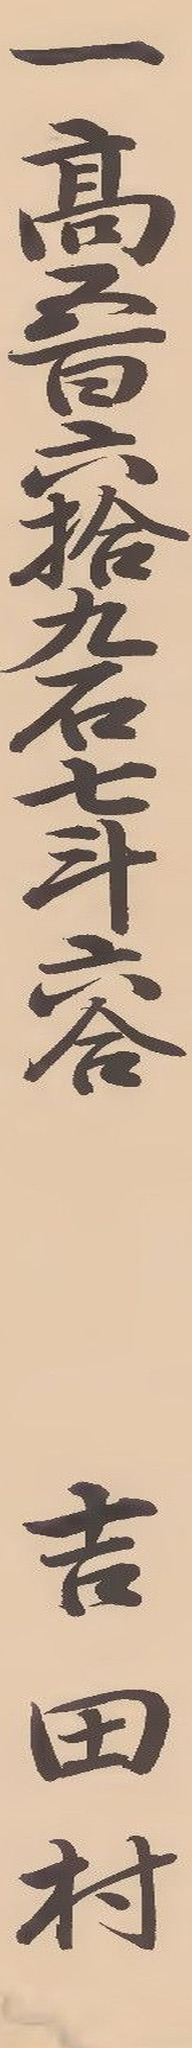一高五百六拾九石七斗六合吉田村

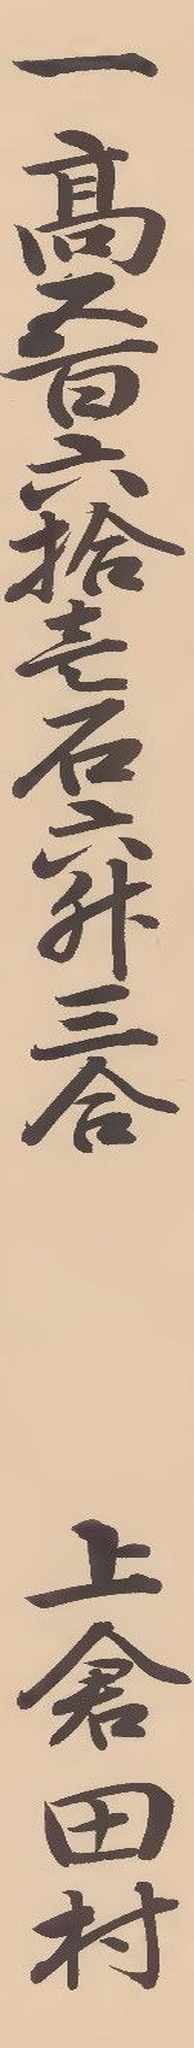一高五百六拾壱石六升三合上倉田村
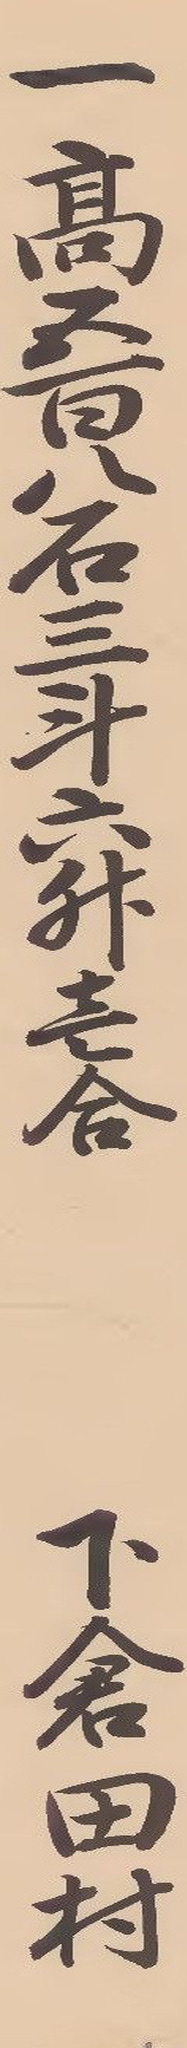一高五百八石三斗六升壱合下倉田村
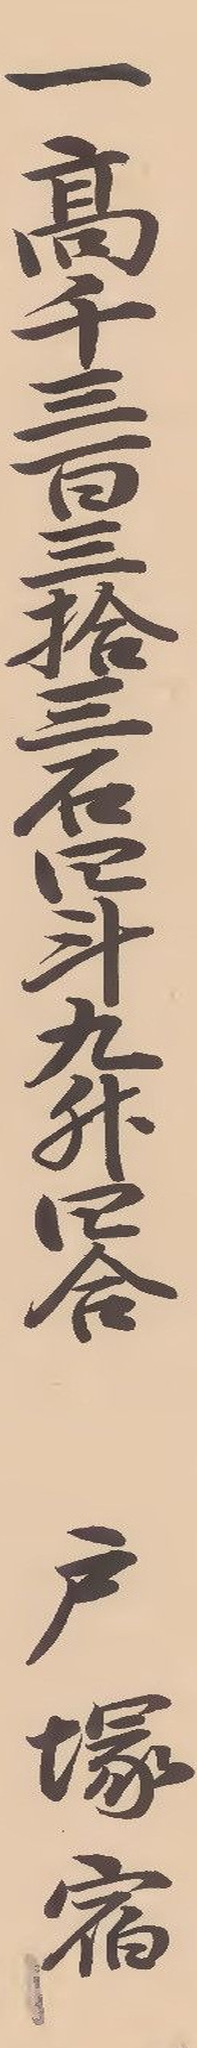一高千三百三拾三石四斗九升四合戸塚宿
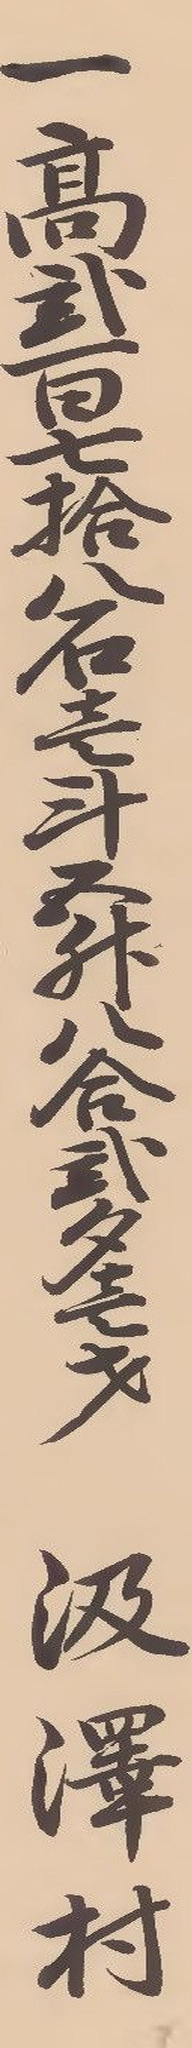一高弐百七拾八石壱斗五升八合弐勺壱才汲澤村
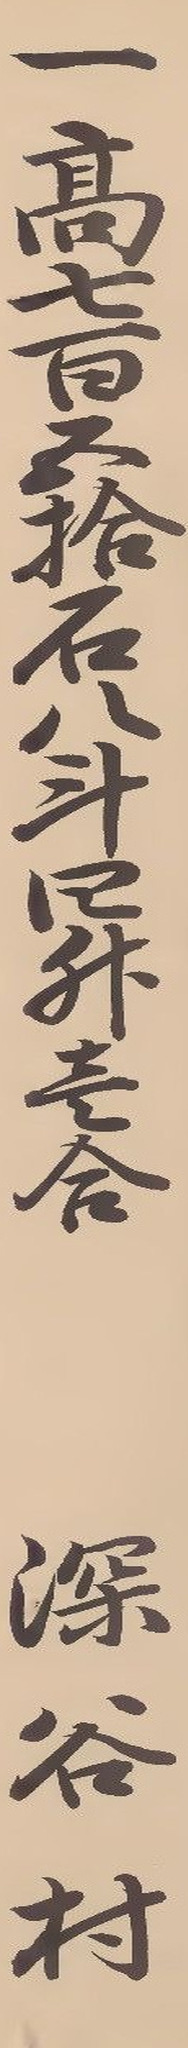一高七百五拾石八斗四升壱合深谷村
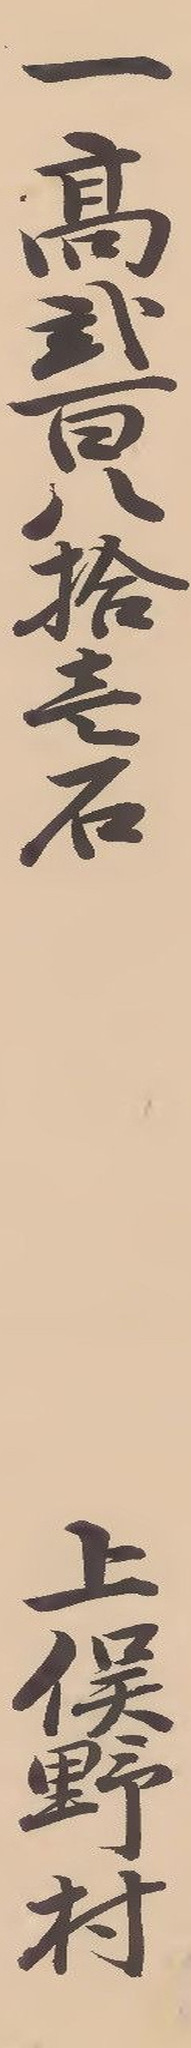一高弐百八拾壱石上俣野村
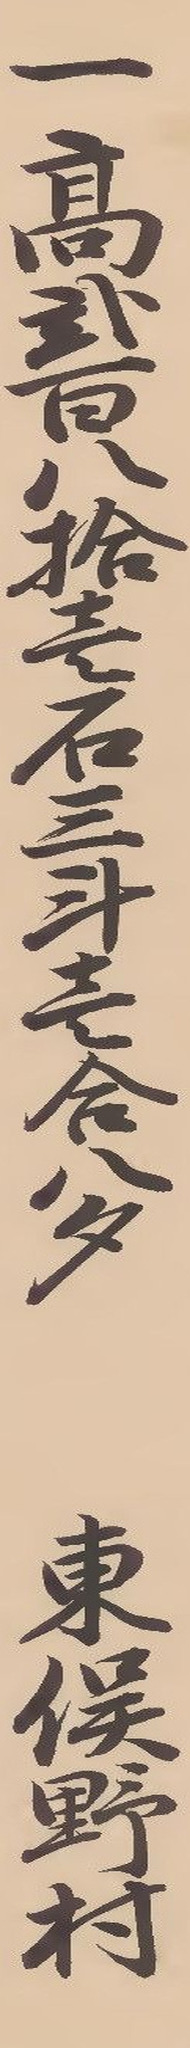一高弐百八拾壱石三斗壱合八勺東俣野村
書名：相模国郷帳
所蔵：国立公文書館 National Archives of Japan
